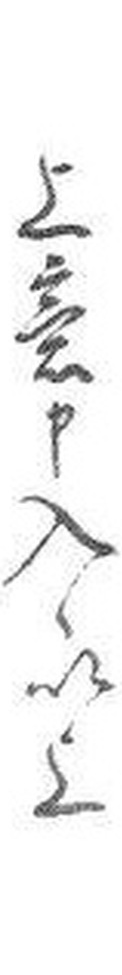上意申入候以上
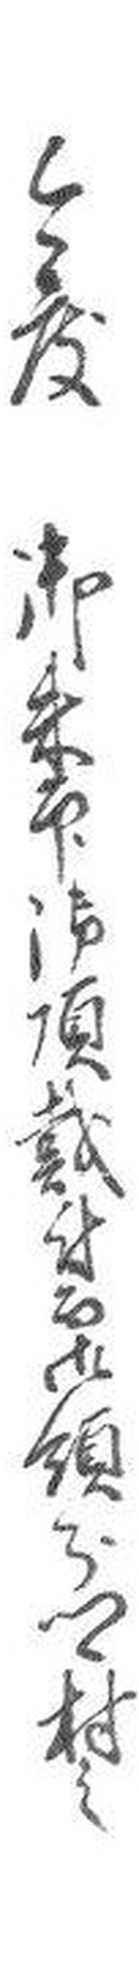今度御朱印御頂戴付而御領分郷村之
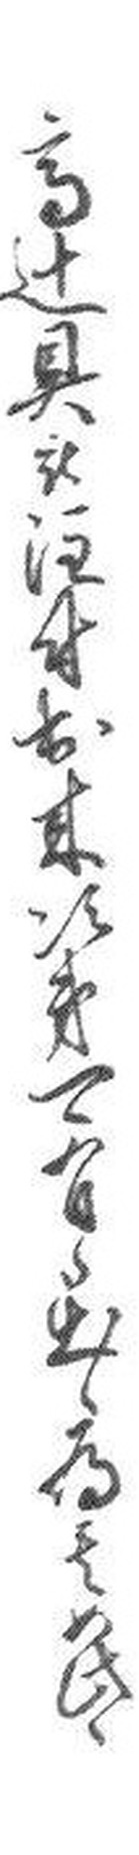高辻具被注付出来次第可有御出候為其如此候
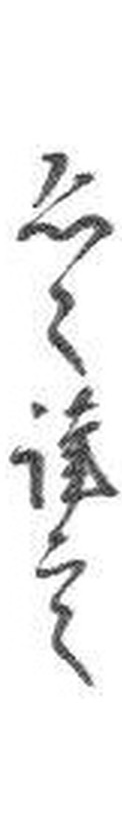恐々謹言
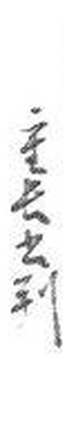重長書判
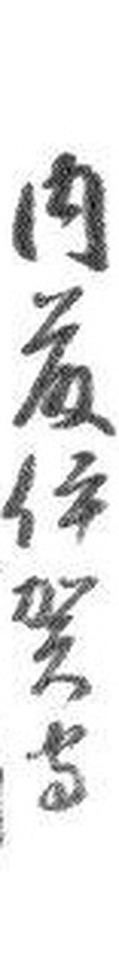内藤伊賀守
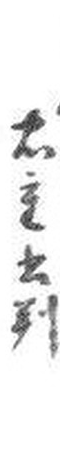忠重書判
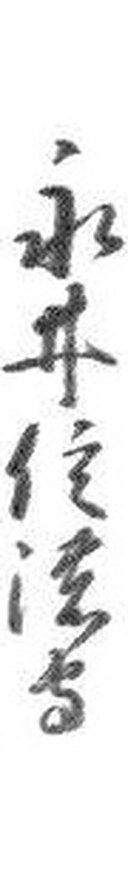永井信濃守
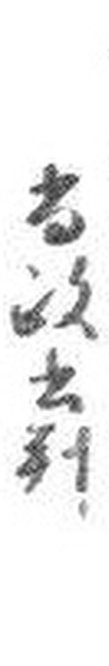尚政書判
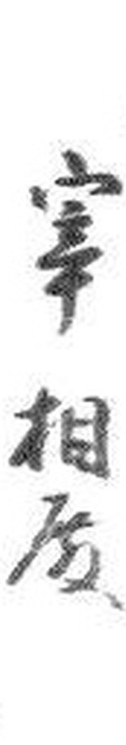宰相殿
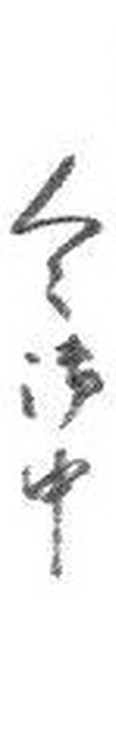人々御中
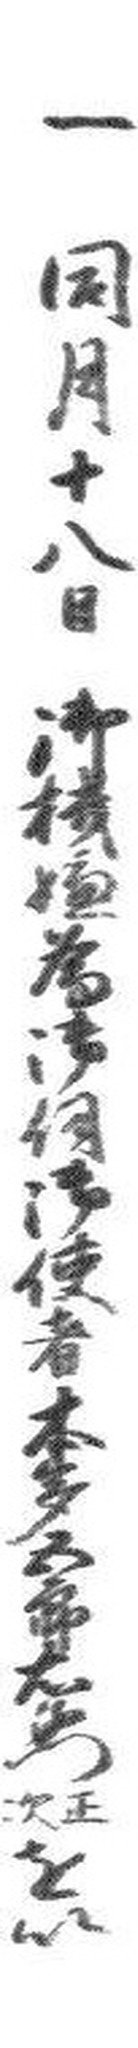一同月十八日御機嫌為御伺御使者本多五郎右衛門正次を以
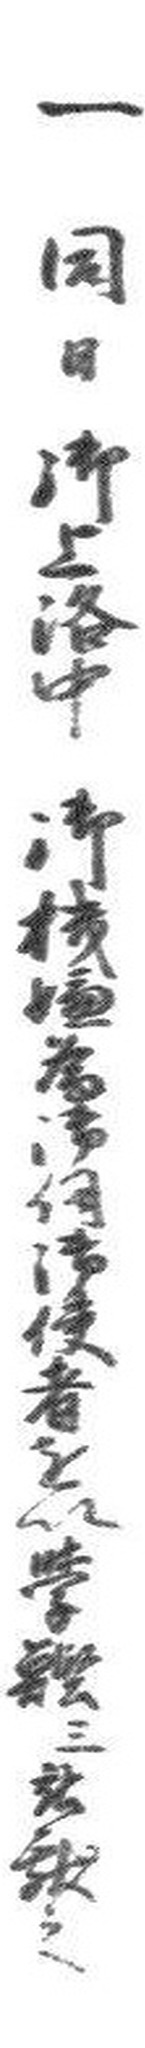一同日御上洛中御機嫌為御伺御使者を以学鰹三被献之

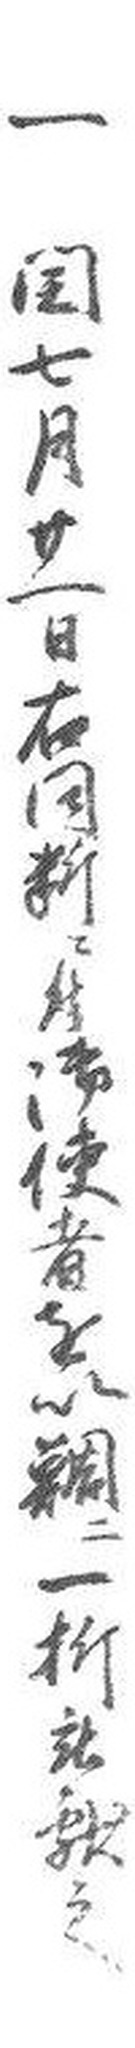一閏七月廿一日右同断ニ付御使者を以鯛二一折被献之
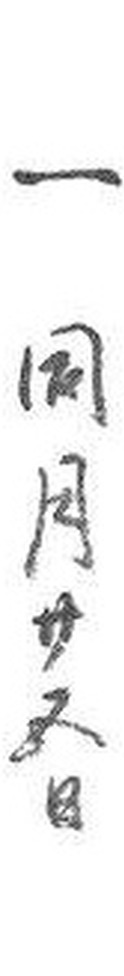一同月廿五日
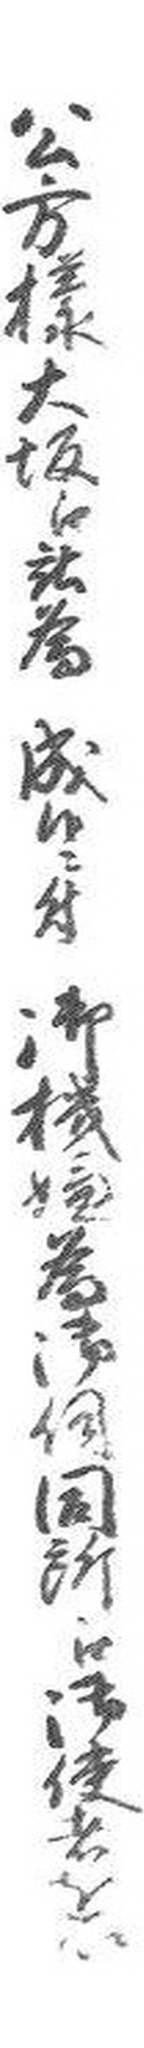公方様大坂江被為成候ニ付御機嫌為御伺同所江御使者を以
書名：家譜 四 忠昌公 従寛永七年到正保四年
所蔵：福井県文書館 Fukui Prefectural Archives
